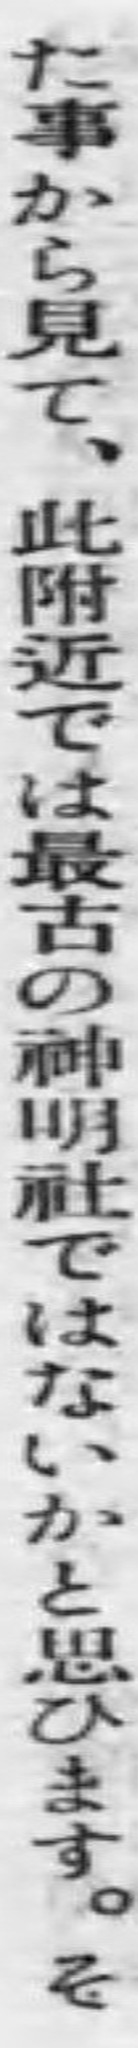た事から見て、此附近では最古の神明社ではないかと思ひます。そ
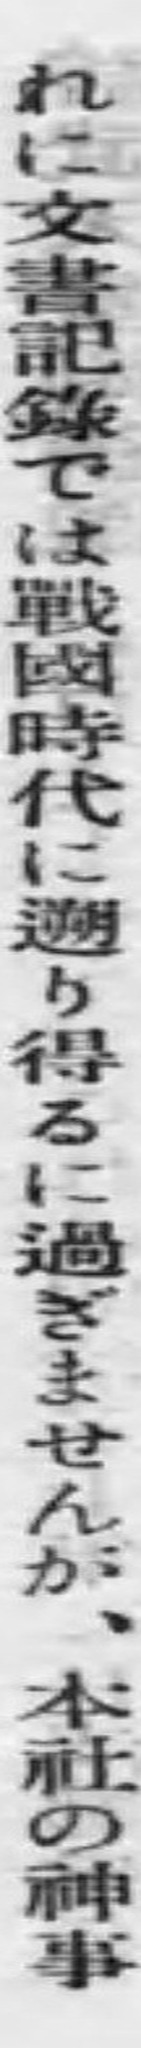れに文書記録では戦国時代に遡り得るに過ぎませんが、本社の神事
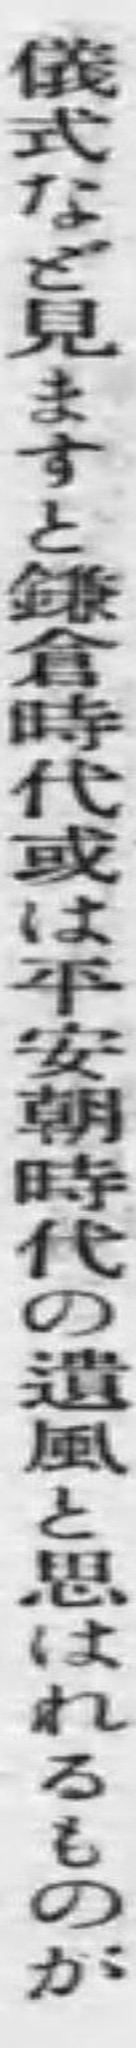儀式など見ますと鎌倉時代或は平安朝時代の遺風と思はれるものが
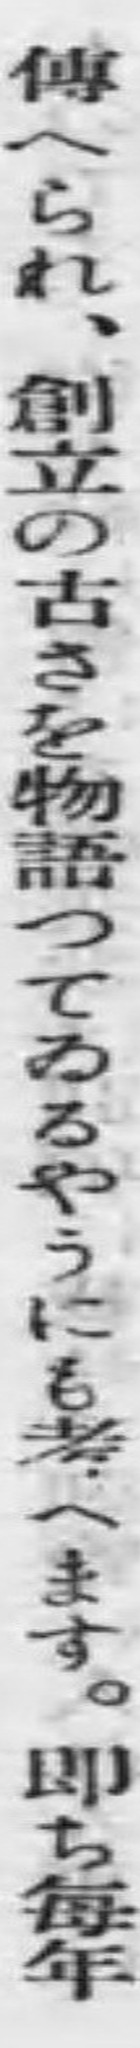伝へられ、創立の古さを物語つてゐるやうにも考へます。即ち毎年
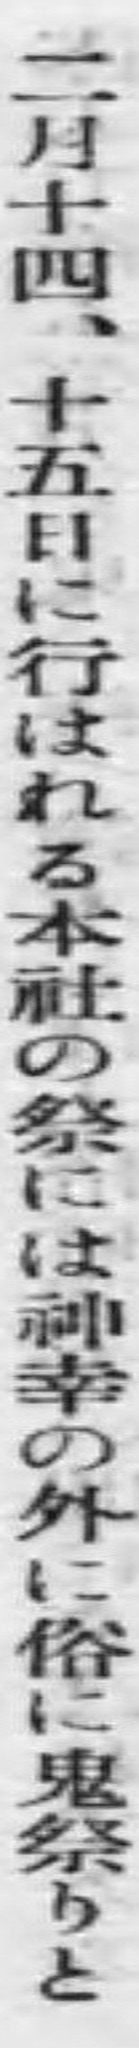二月十四、十五日に行はれる本社の祭には神幸の外に俗に鬼祭りと
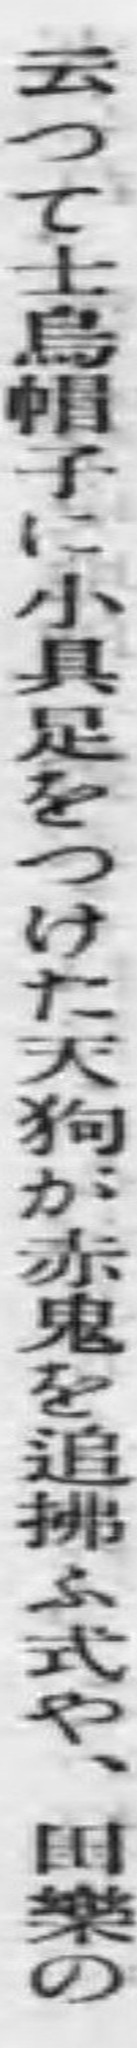云つて士烏帽子に小具足をつけた天狗が赤鬼を追払ふ式や、田楽の
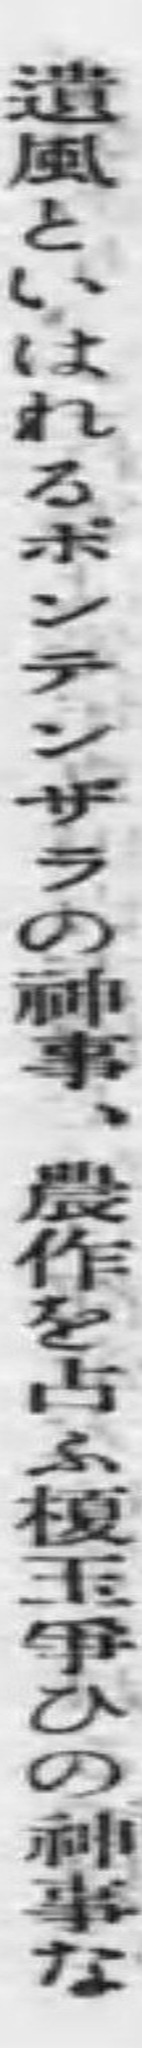遺風といはれるボンテンザラの神事、農作を占ふ榎玉争ひの神事な

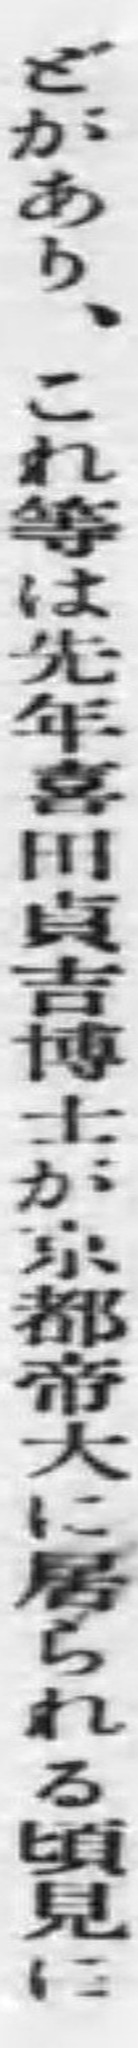どがあり、これ等は先年喜田貞吉博士が京都帝大に居られる頃見に
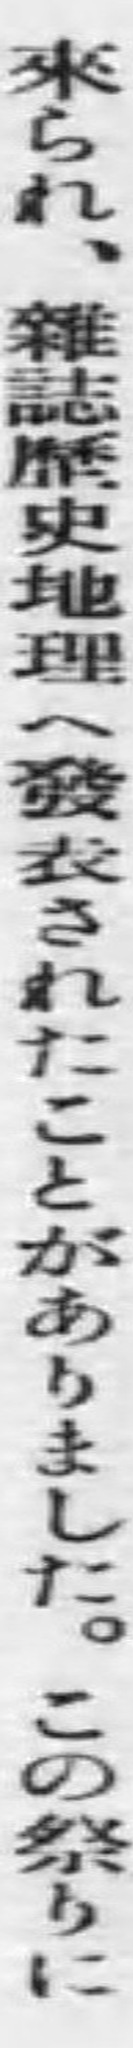来られ、雑誌歴史地理へ発表されたことがありました。この祭りに
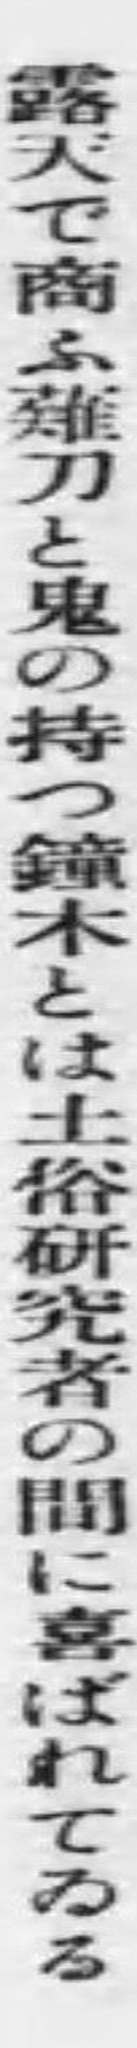露天で商ふ薙刀と鬼の持つ鐘木とは土俗研究者の間に喜ばれてゐる
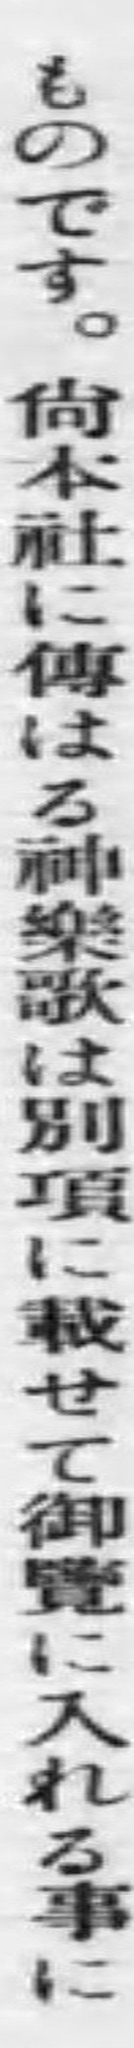ものです。尚本社に伝はる神楽歌は別項に載せて御覧に入れる事に
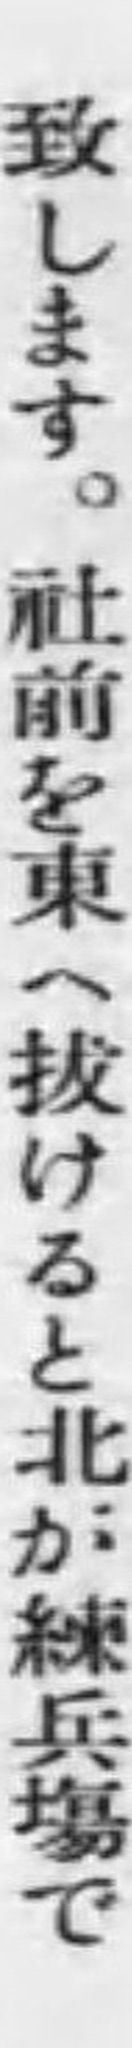致します。社前を東へ抜けると北が練兵場で
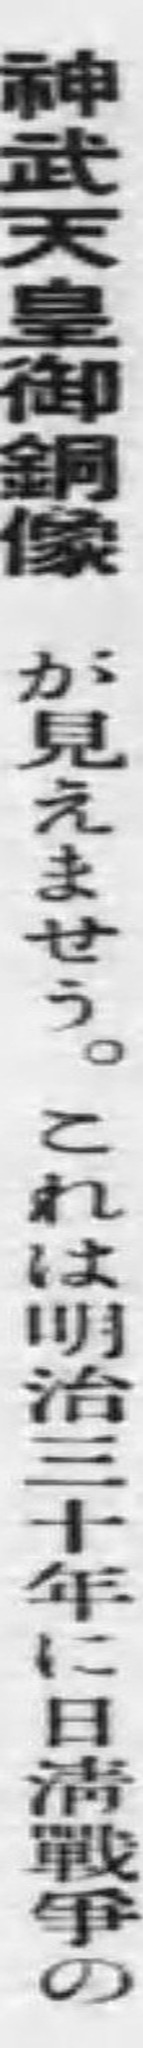神武天皇御銅像が見えませう。これは明治三十年に日清戦争の
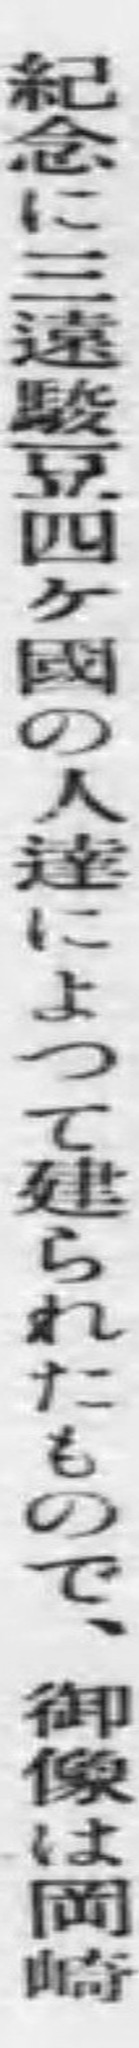紀念に三遠駿豆四ヶ国の人達によつて建られたもので、御像は岡崎
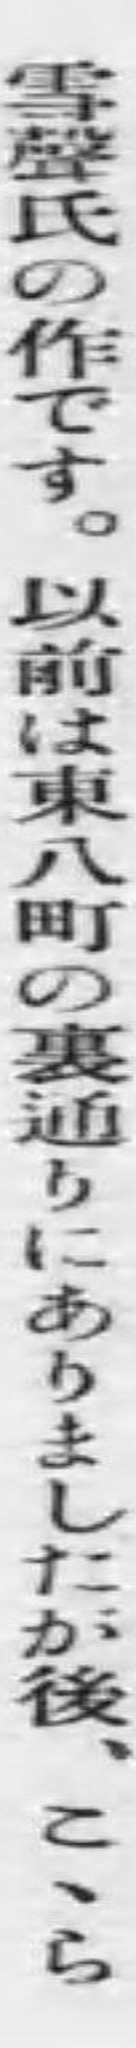雪声氏の作です。以前は東八町の裏通りにありましたが後、こゝら
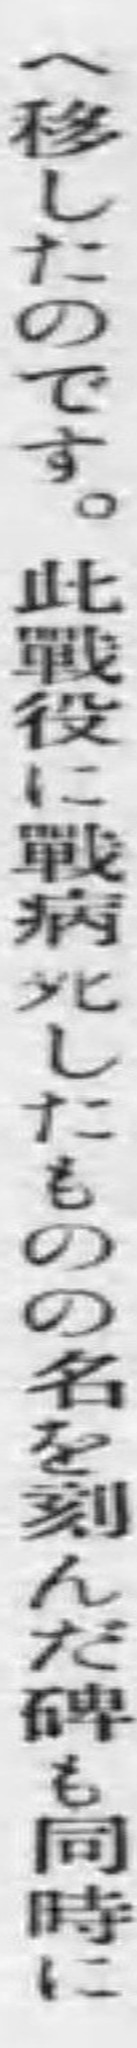へ移したのです。此戦役に戦病死したものの名を刻んだ碑も同時に
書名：東三河道中記 : 豊橋市及其附近案内
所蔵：国立国会図書館 National Diet Library, JAPAN
